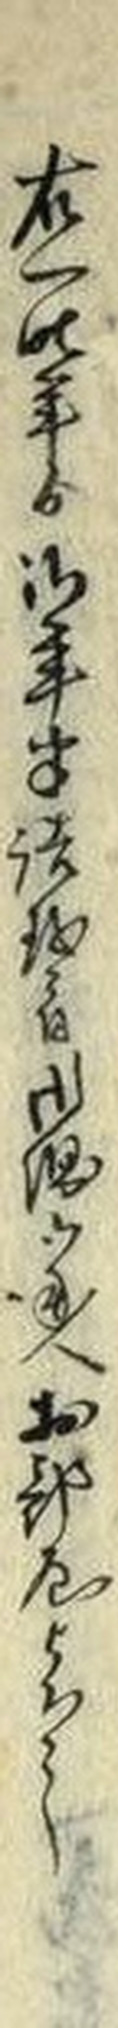右一昨年ゟ弐年半詰越ニ付御側御用人於部屋被下之

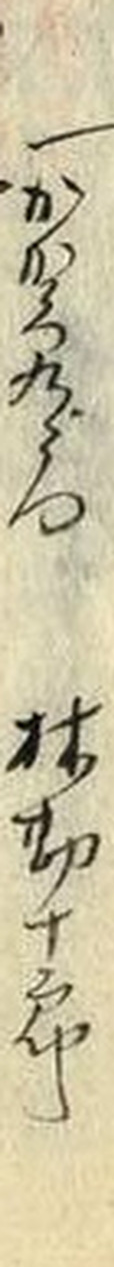加賀九郎右衛門林勘十郎
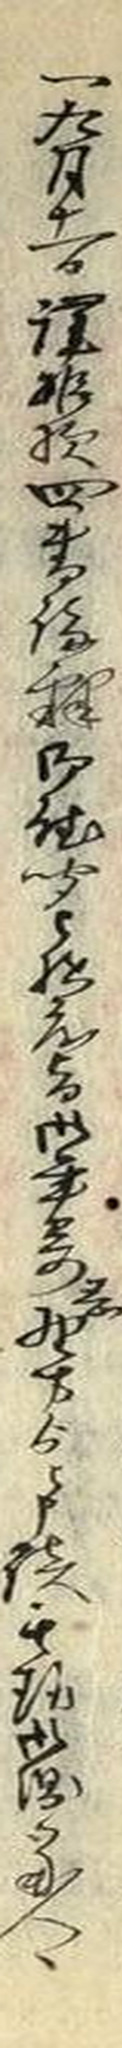一九月十一日謹姫様四書講釈御聴聞被遊度旨御年寄岡野方ゟ被申談其趣御側御用人へ
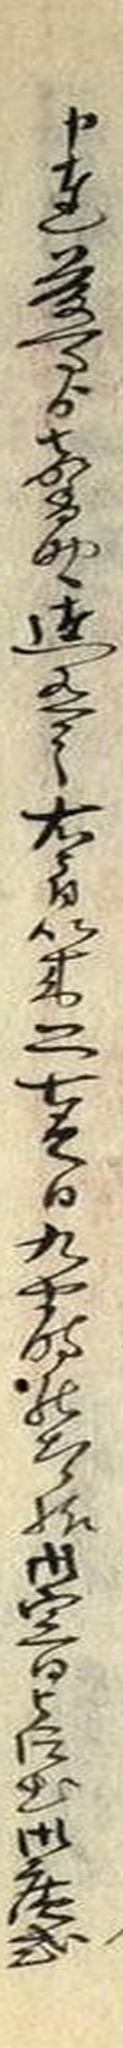申達藤馬ゟ馨助へ達有之右ニ付以来二七之日九半時罷出候様御定日被仰出御広式
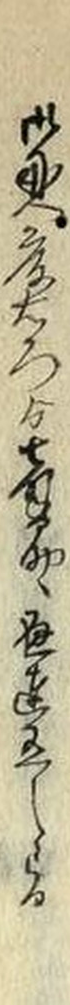御用人藤右衛門ゟ馨助へ通達有之候旨
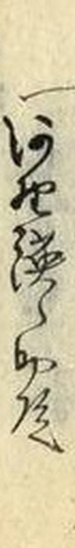河野鍈之助殿
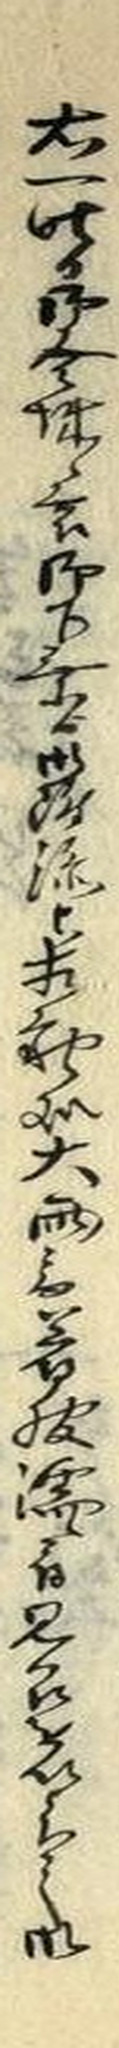右一昨日御登城之節御下乗ゟ御附添被相勤候処大雨ニ而着服濡候ニ付思召を以被下之御
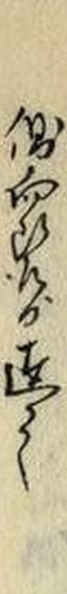側向頭取ゟ達之
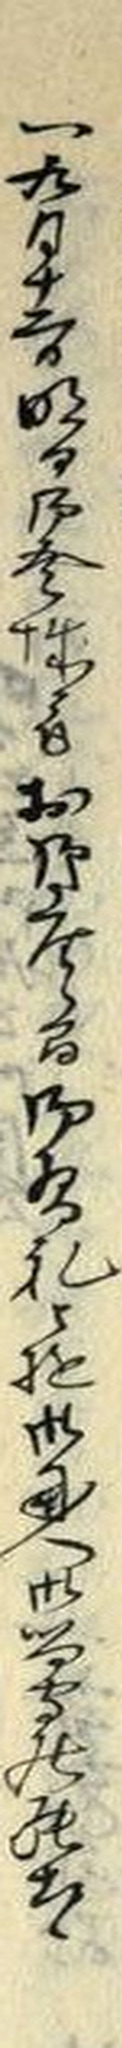一九月十二日明日御登城ニ付於御座之間御習礼被遊御用人御留守居罷出候
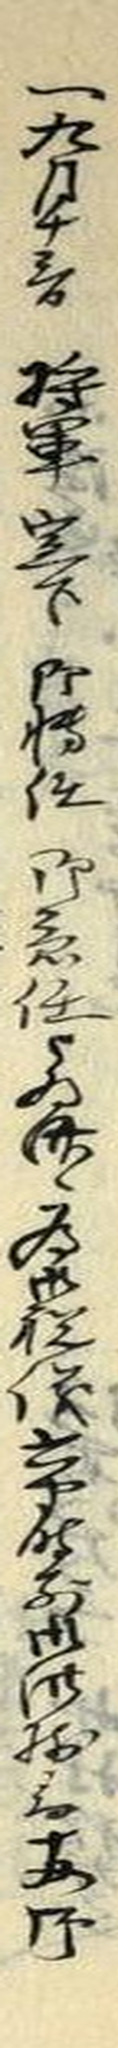一九月十三日将軍宣下御転任御兼任被為済候為御祝儀六半時前御供揃ニ而両御
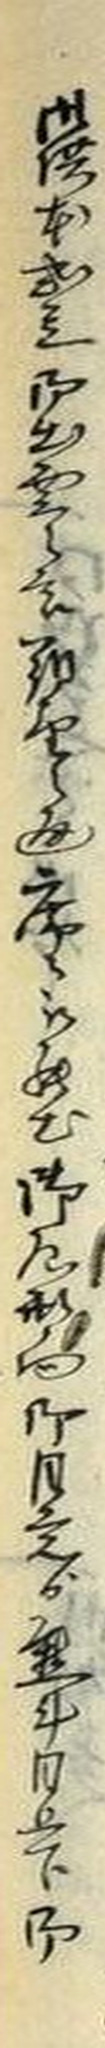御供本式立御出殿之節朔望之通席々被罷出御屋形向御目覚ゟ熨斗目上下御
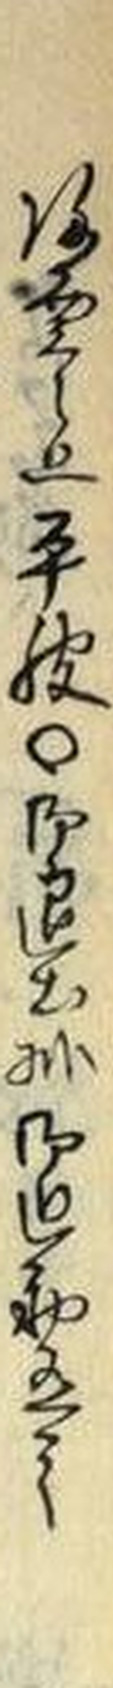帰殿之上平服〇御退出掛御廻勤有之
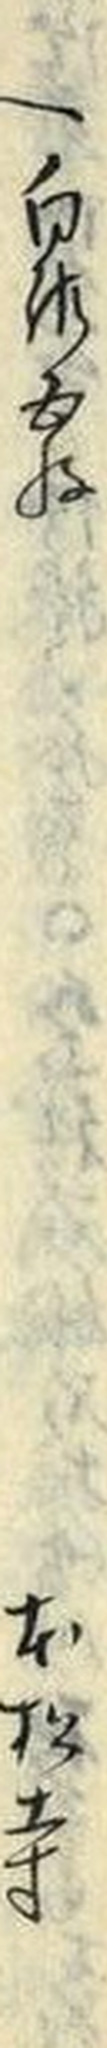白銀五枚本松寺
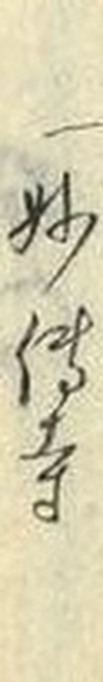妙伝寺
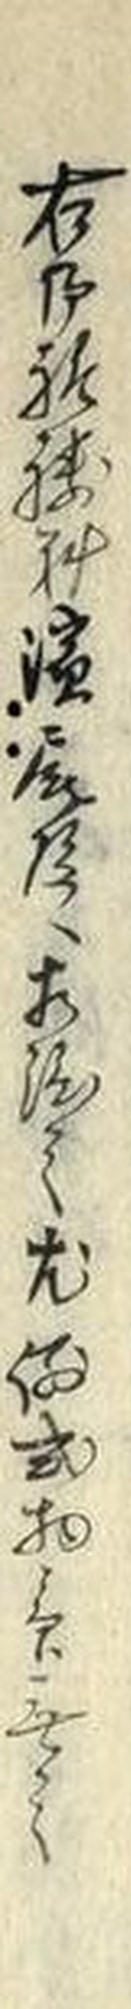右御祈禱料浜尾殿へ相渡之尤例式物ニ而ハ無之

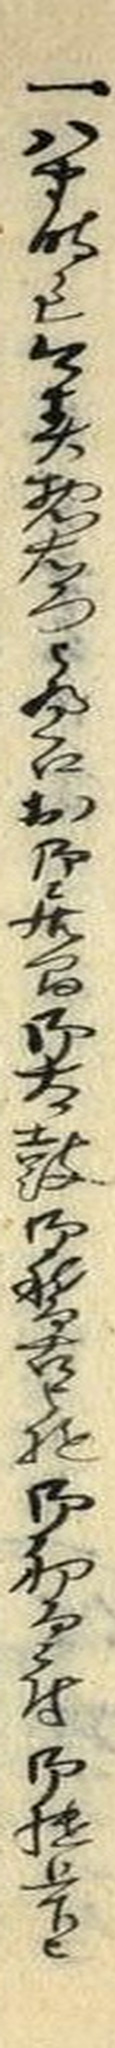一八半時過今春惣右衛門被為召於御居間御太鼓御稽古被遊御初而ニ付御継上下被
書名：少傅日録抄（斉善付側向頭取日記、在府）
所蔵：福井県文書館 Fukui Prefectural Archives
